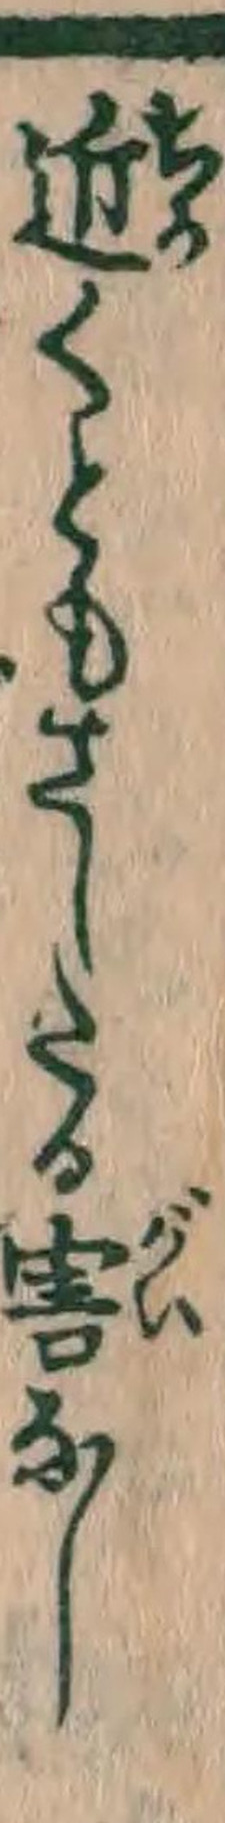近くともさしたる害なし
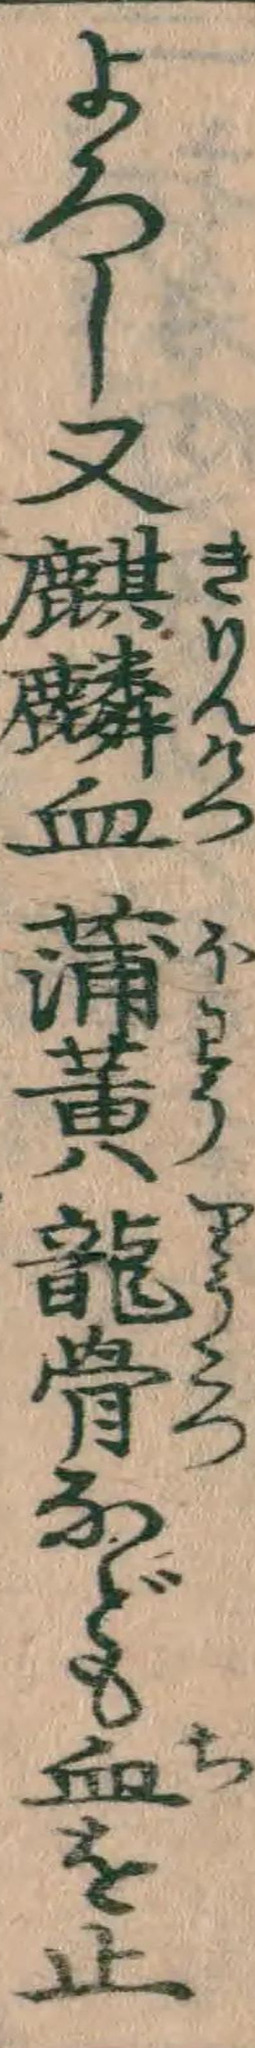よろし又麒麟血蒲黄竜骨なども血を止
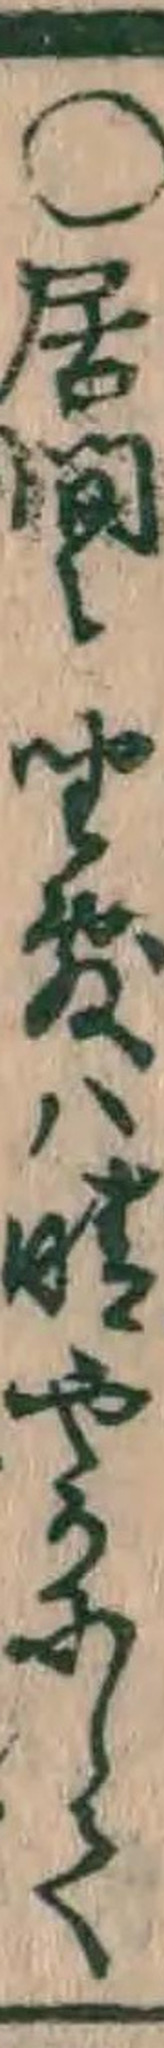○居間座敷は晴やかにして
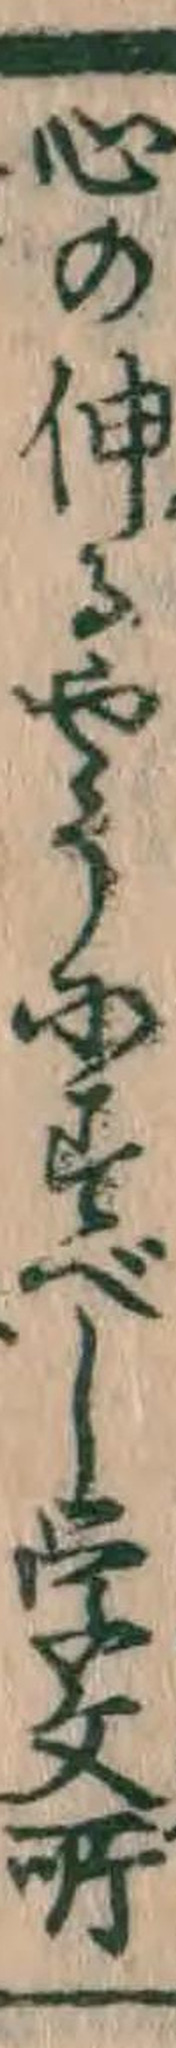心の伸るやうにすべし学問所
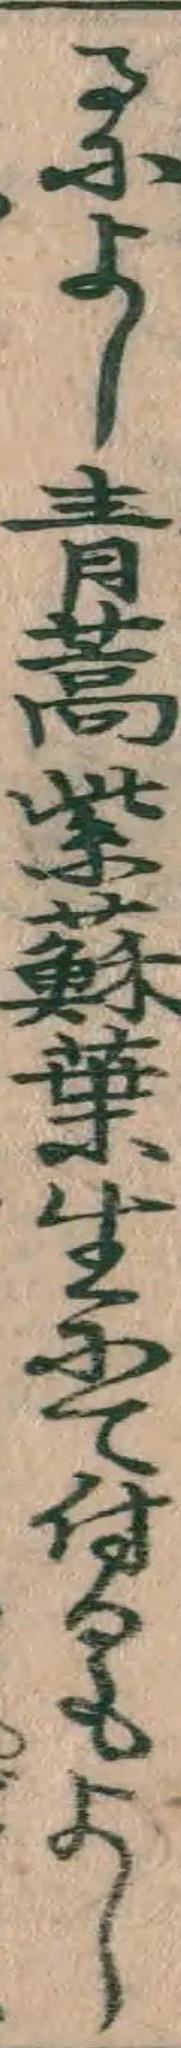るによし青蒿紫蘇葉生にて付るもよし
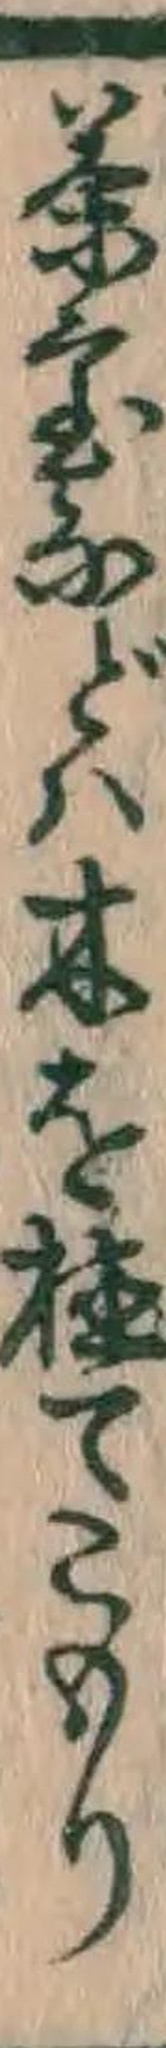茶室などは木を植てこもり
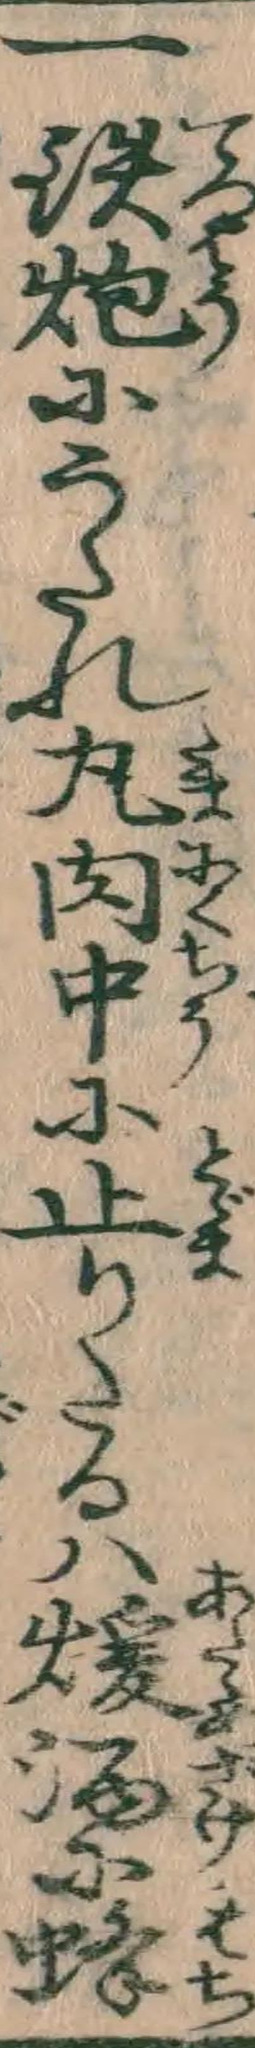一鉄炮にうたれ丸肉中に止りたるは煖酒に蜂
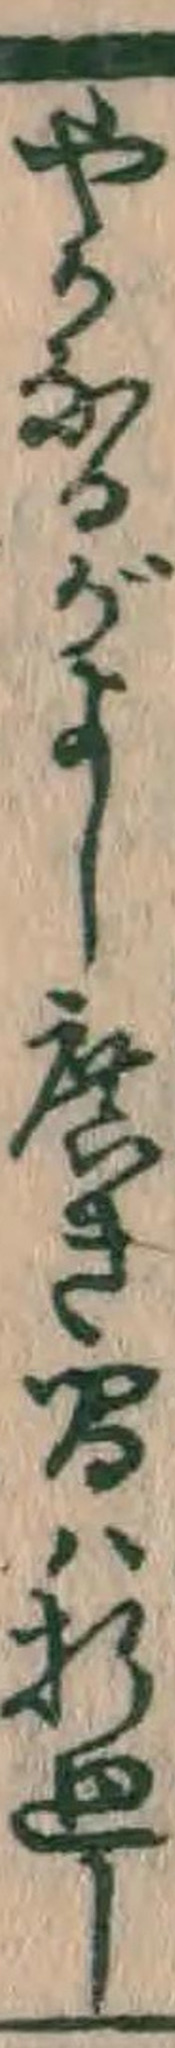やうなるがよし広き間は折廻し
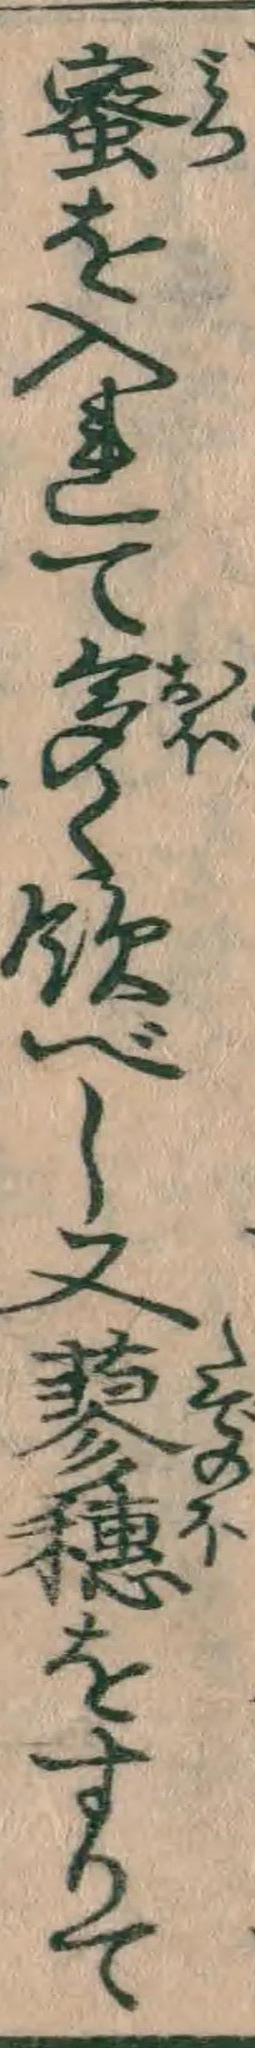蜜を入れて多く飲べし又蓼穂をすりて
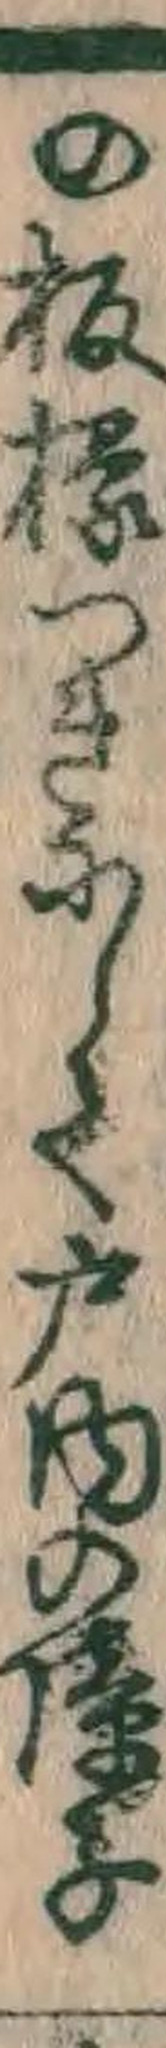の板椽つきにして戸内の障子
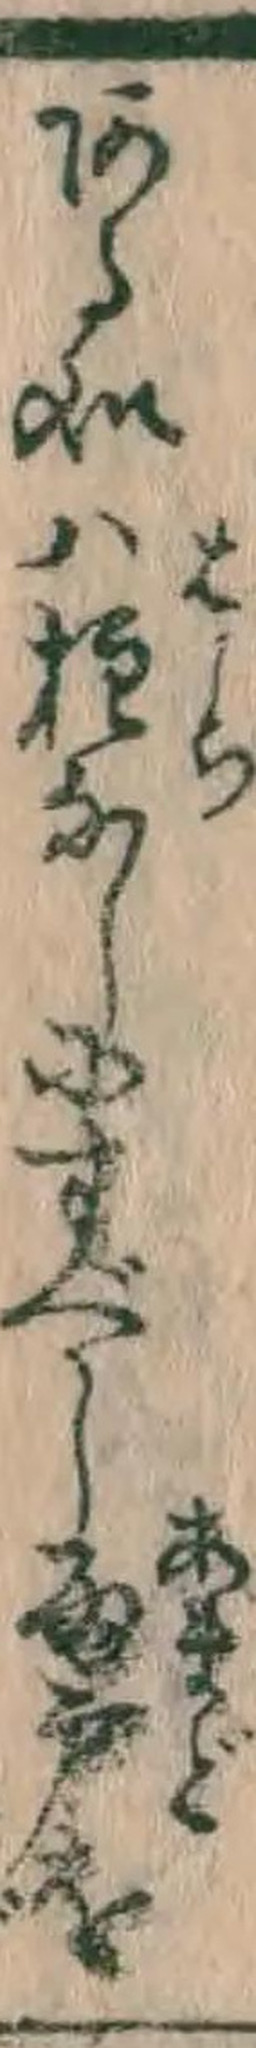ある処は柱なしにすべし雨戸を
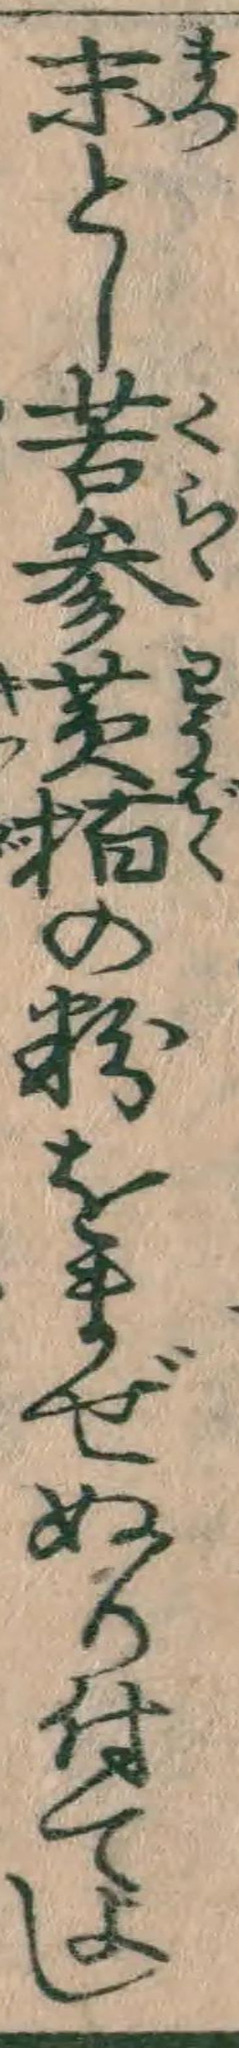末とし苦参黄柏の粉をまぜぬり付てよし
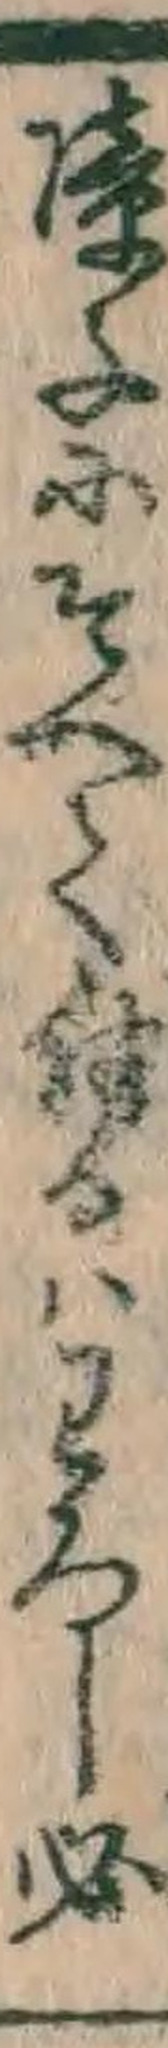障子にそへて付るはわろし必
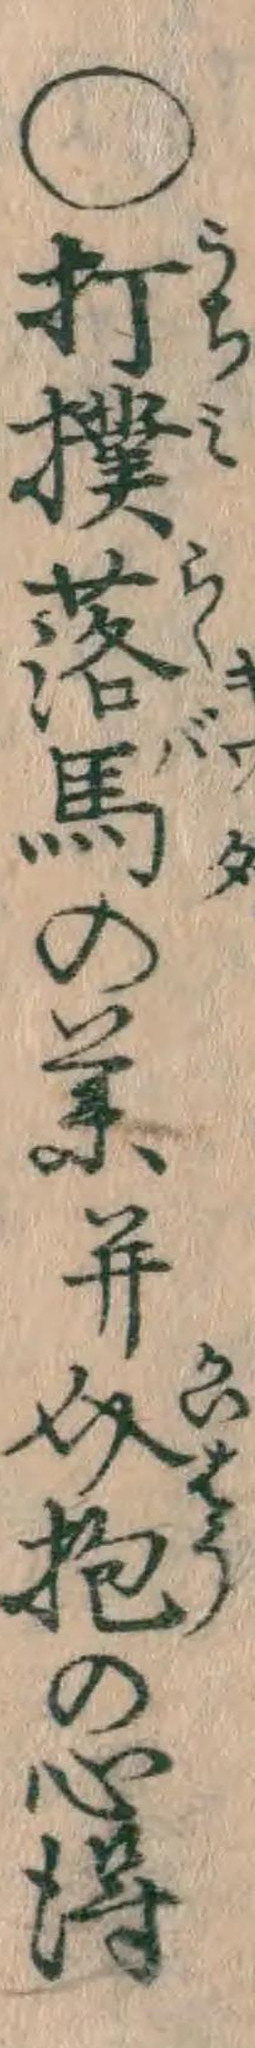○打撲落馬の薬并介抱の心得
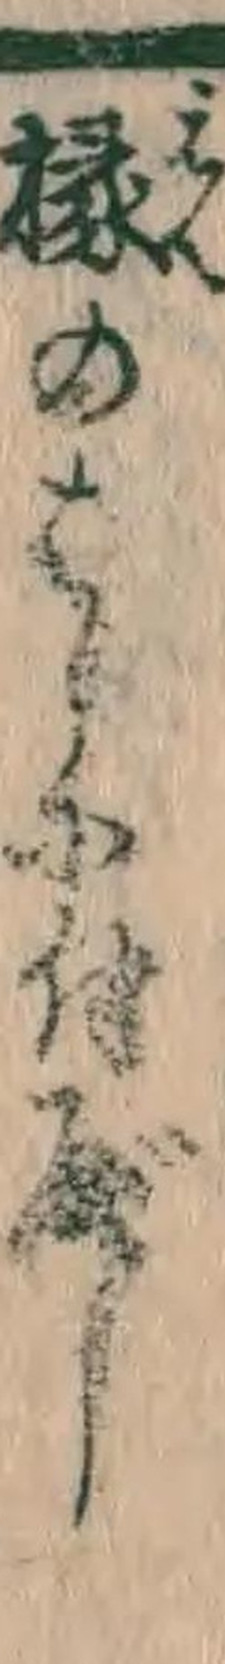椽のはしに付べし
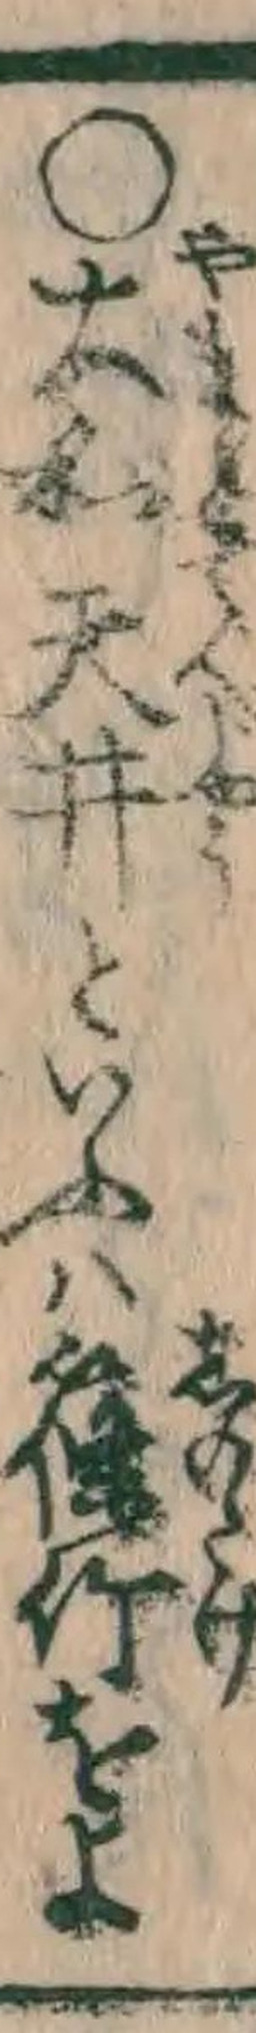○大和天井といふは篠竹をよ
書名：広益秘事大全 3巻. [3]
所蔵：国立国会図書館 National Diet Library, JAPAN
